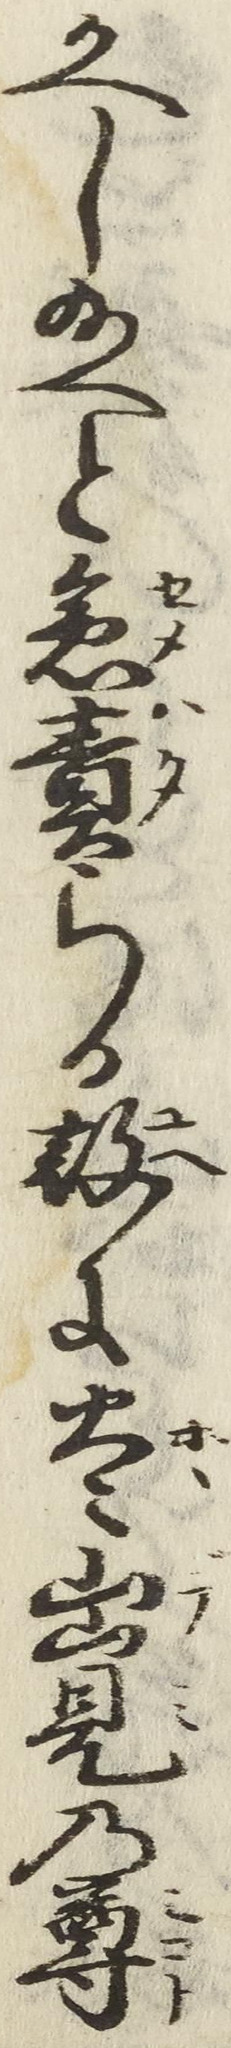かへし給へと急責らる故に火火出見の尊

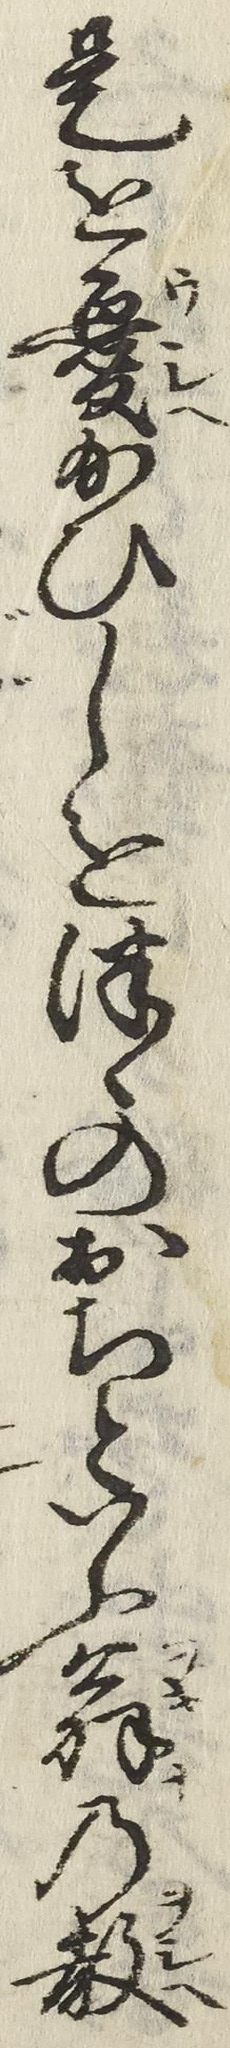是を憂給ひしをつゝのおちといふ翁の教
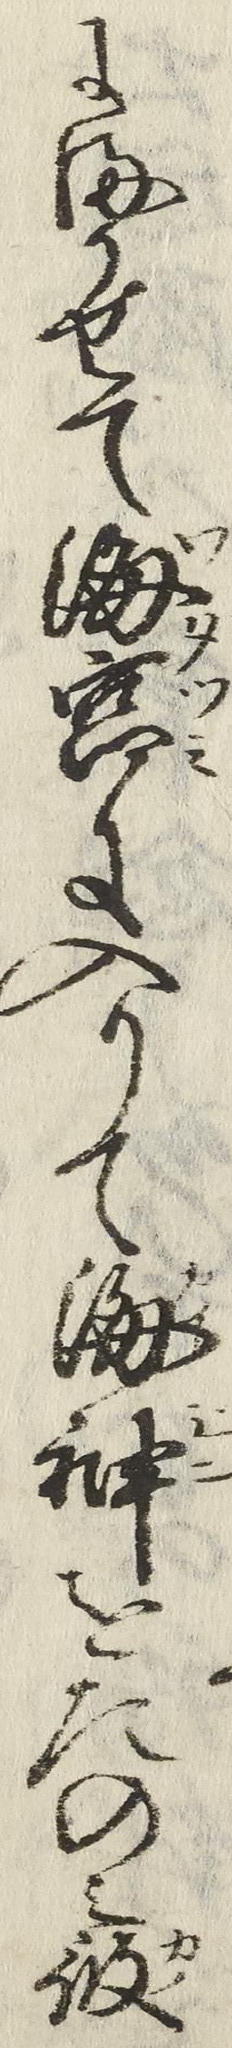にまかせて海宮に入りて海神をたのみ彼
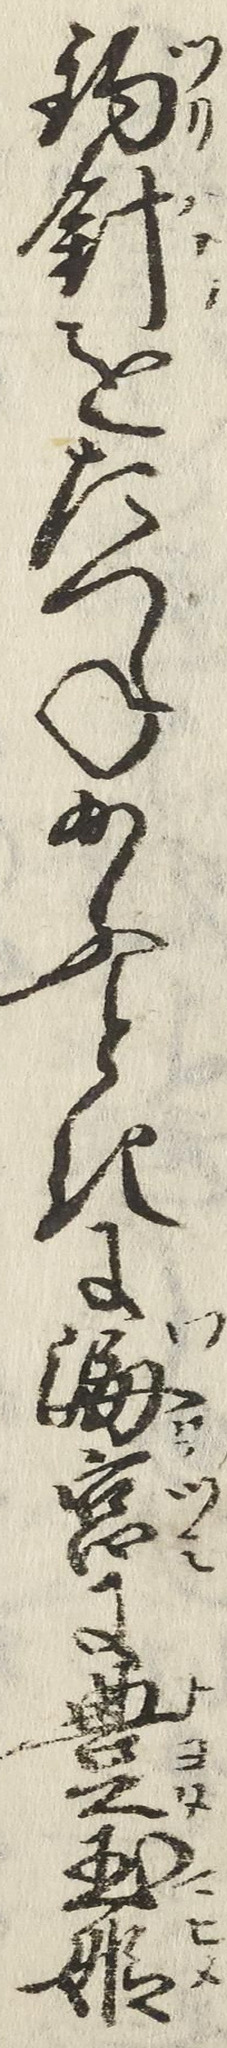釣針をたつね給ふときに海宮に豊玉姫
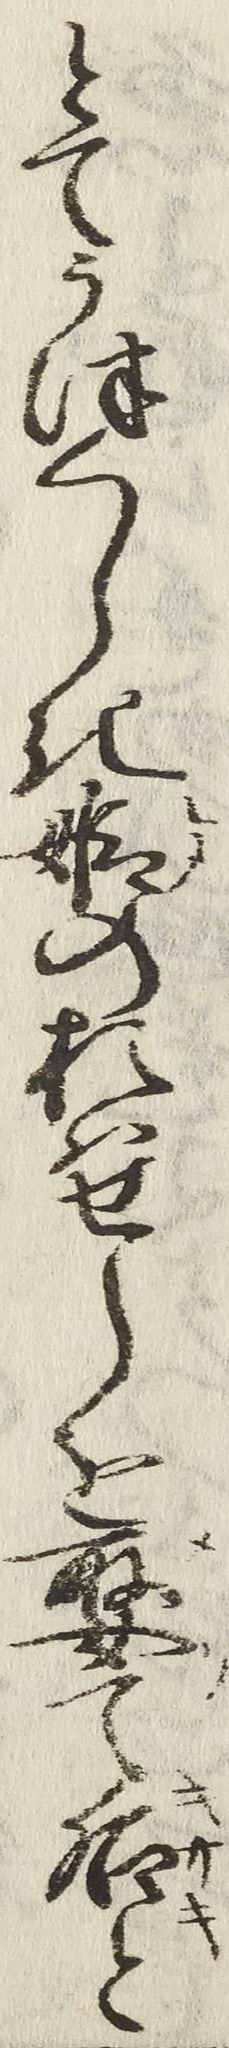とてうつくしき姫のおはせしを娶て后と
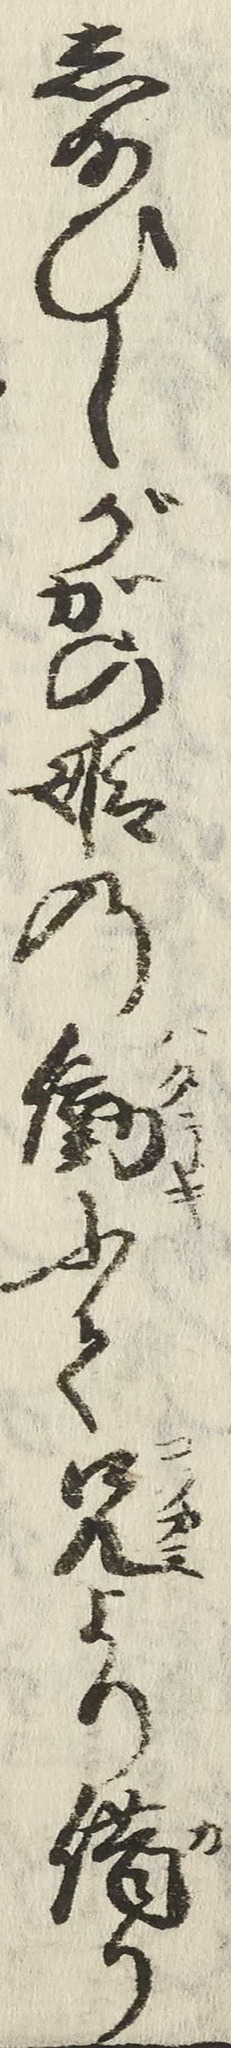し給ひしがかの姫の働にて兄より借り
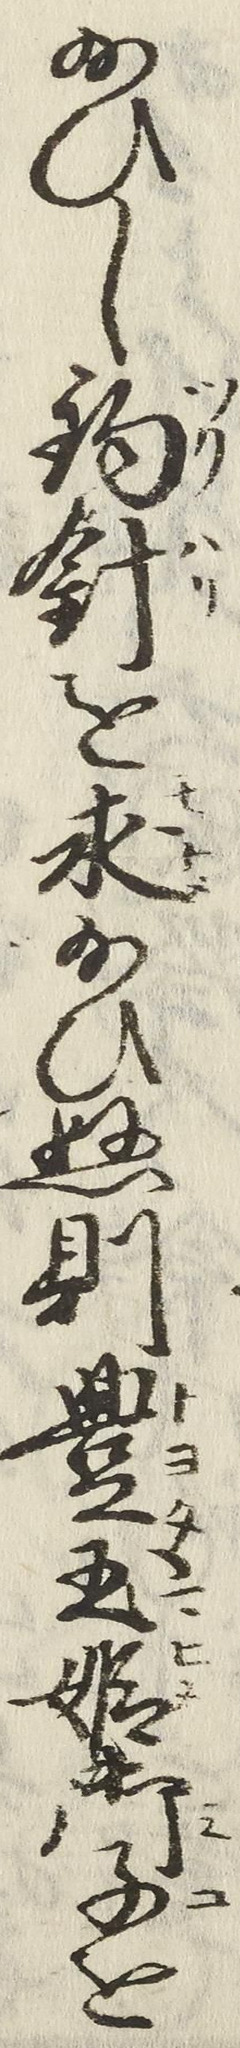給ひし釣針を求給ひぬ則豊玉姫御子を
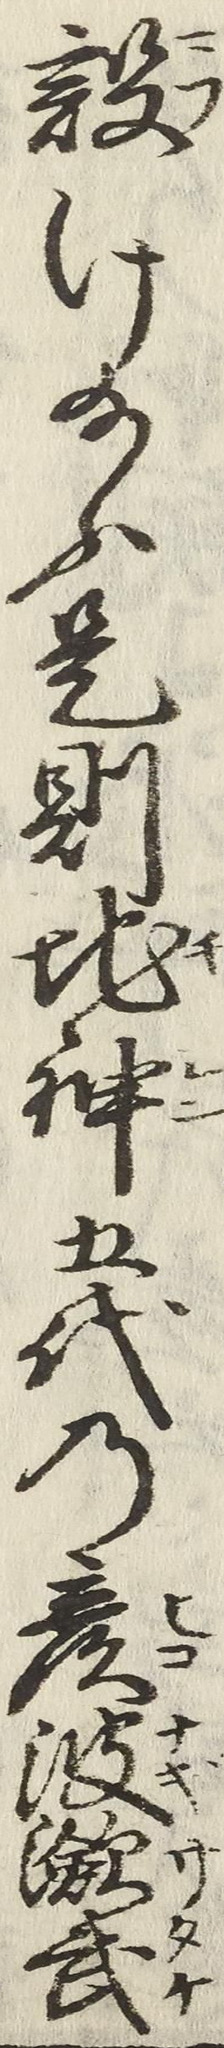設け給ふ是則地神五代の彦波瀲武
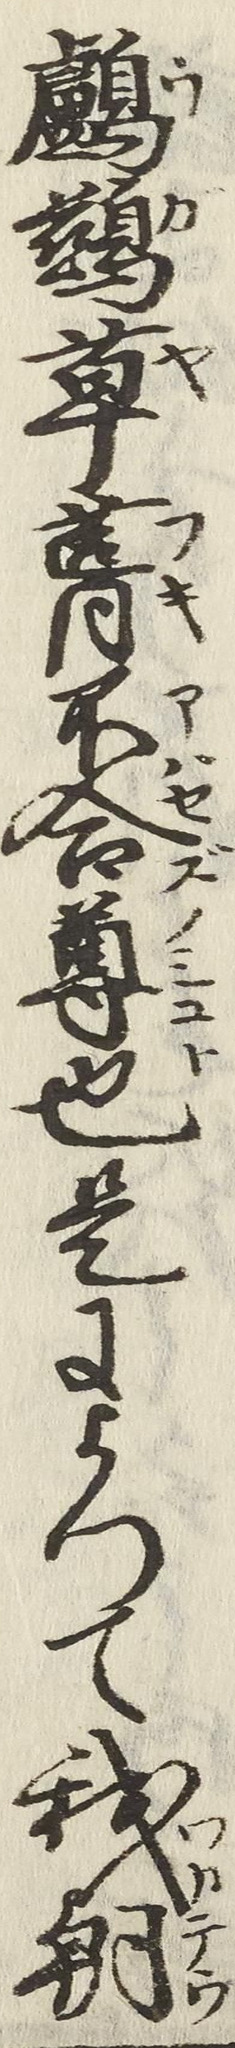鸕鸛草葺不合尊也是によつて我朝
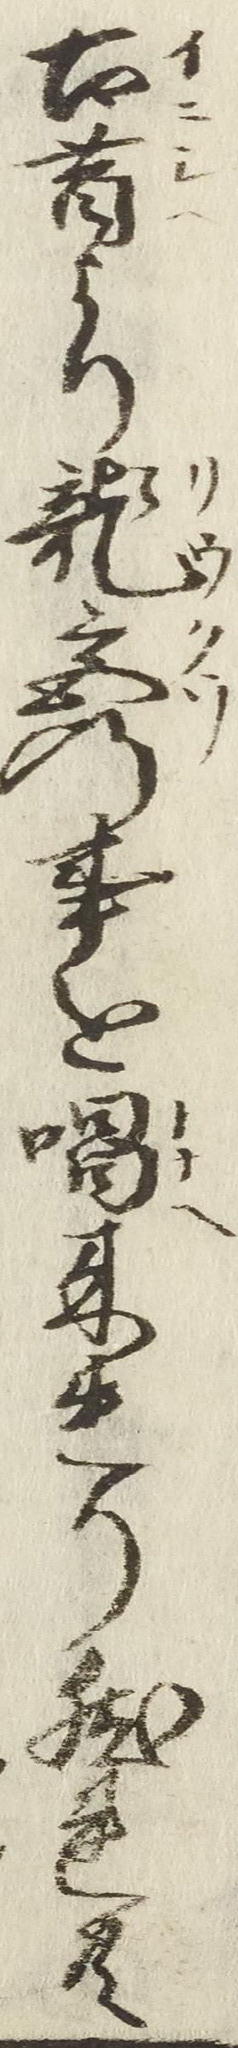古昔より龍宮の事を唱来れり然れ共
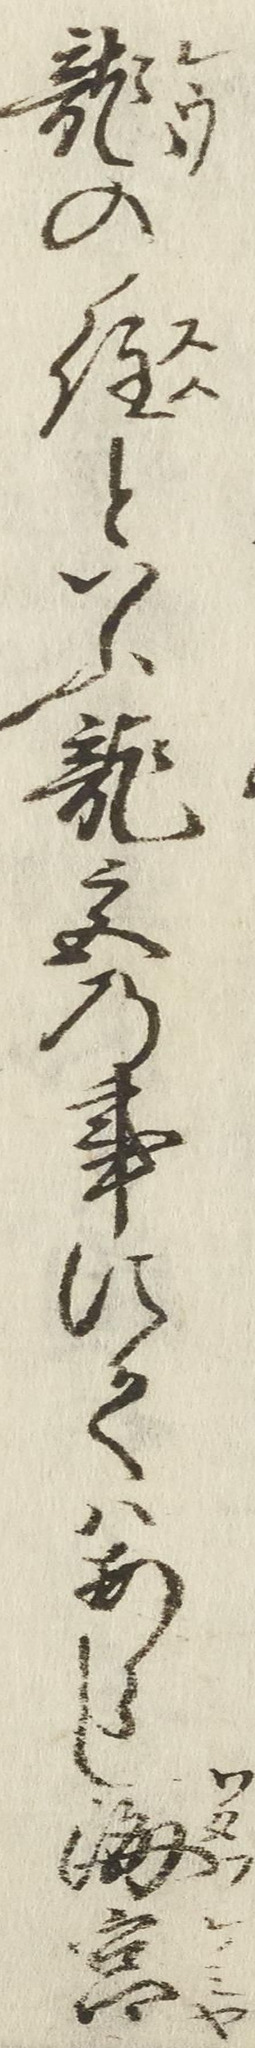龍の住といふ龍宮の事にてはあらし海宮
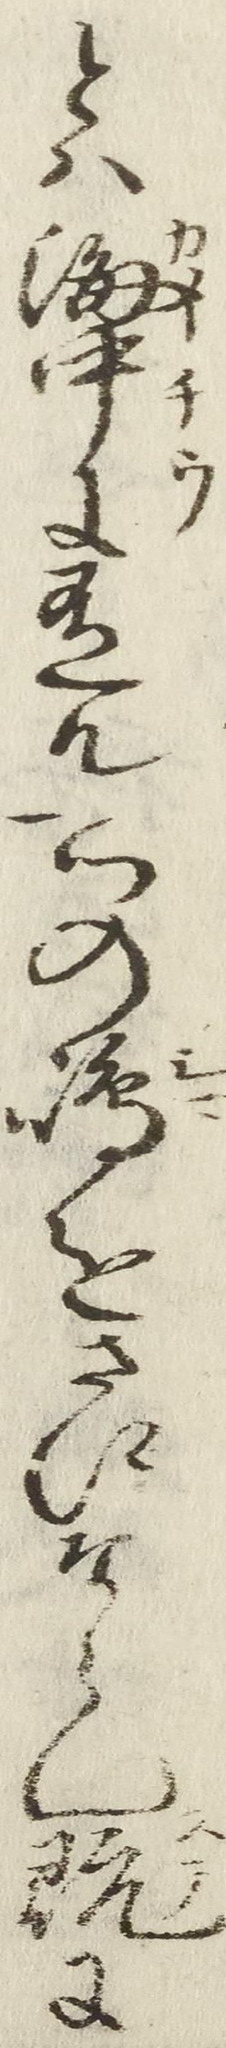とは海中に有ル一ツの嶋をさすならん既に
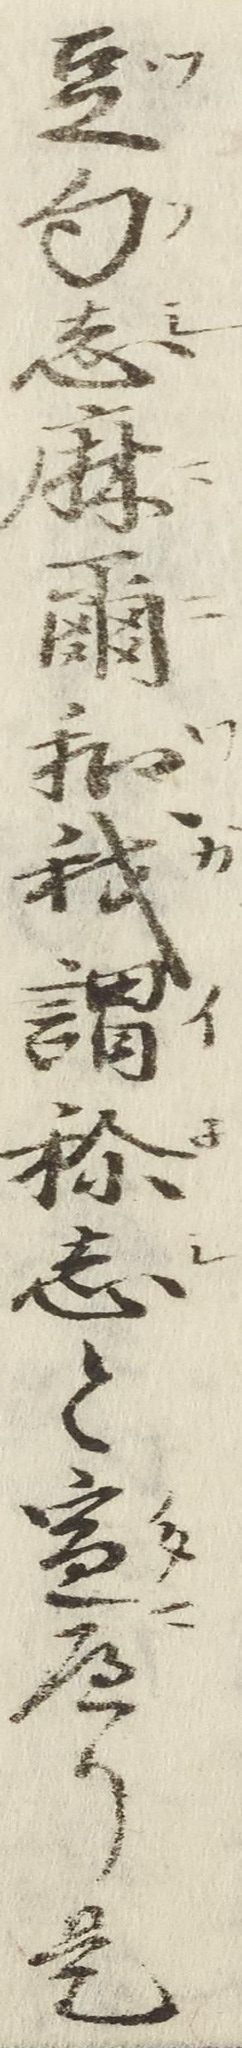豆句志麻爾和我謂称志と宣へり是
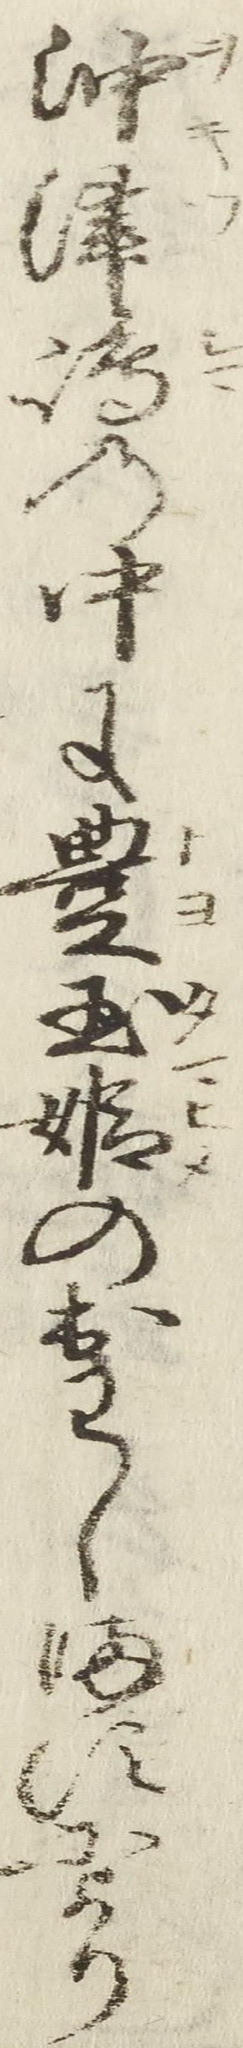沖津嶋の中に豊玉姫のおわしますにより
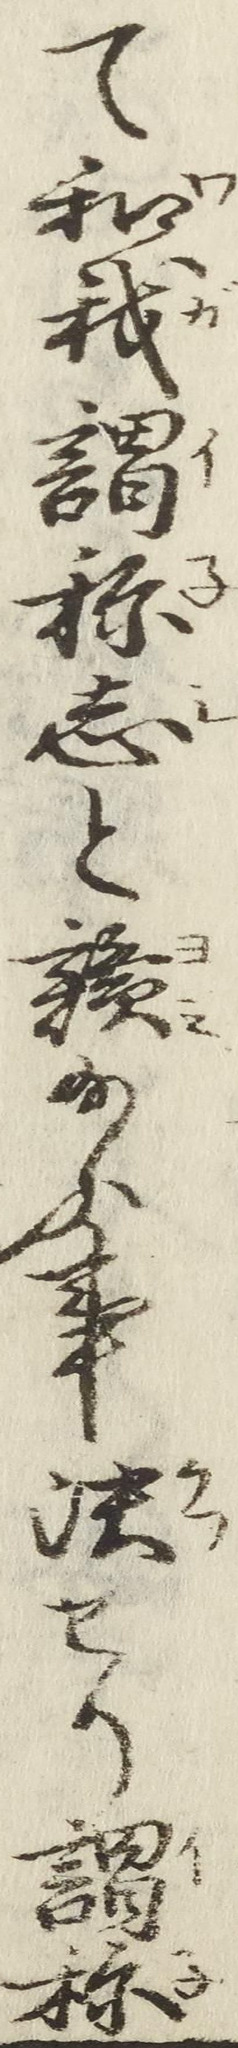て和我謂称志と読給ふ事決せり謂称
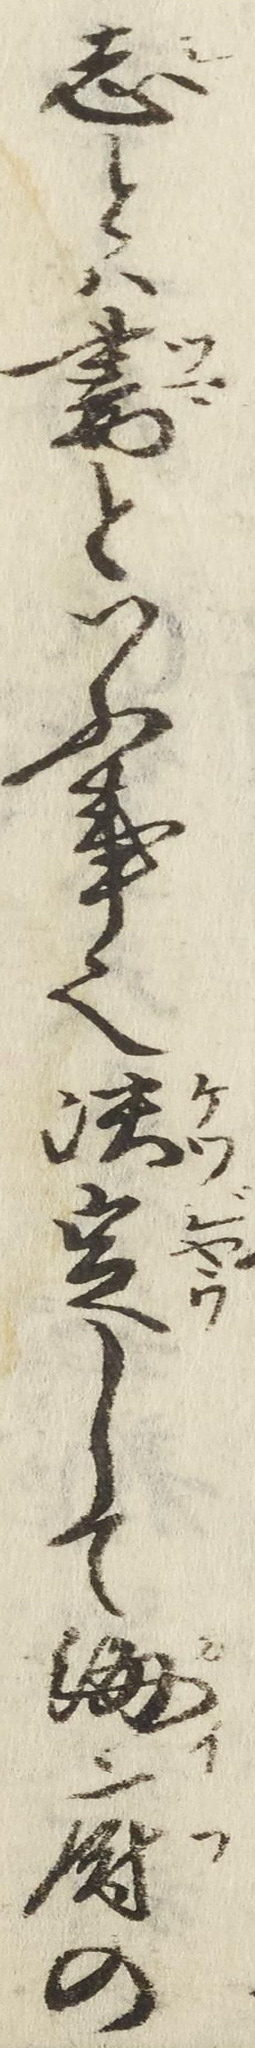志とは妻といふ事なり決定して海府の
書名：天地或問珍　天
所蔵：東京大学地震研究所図書室 Earthquake Research Institute Library, The University of Tokyo, JAPAN
